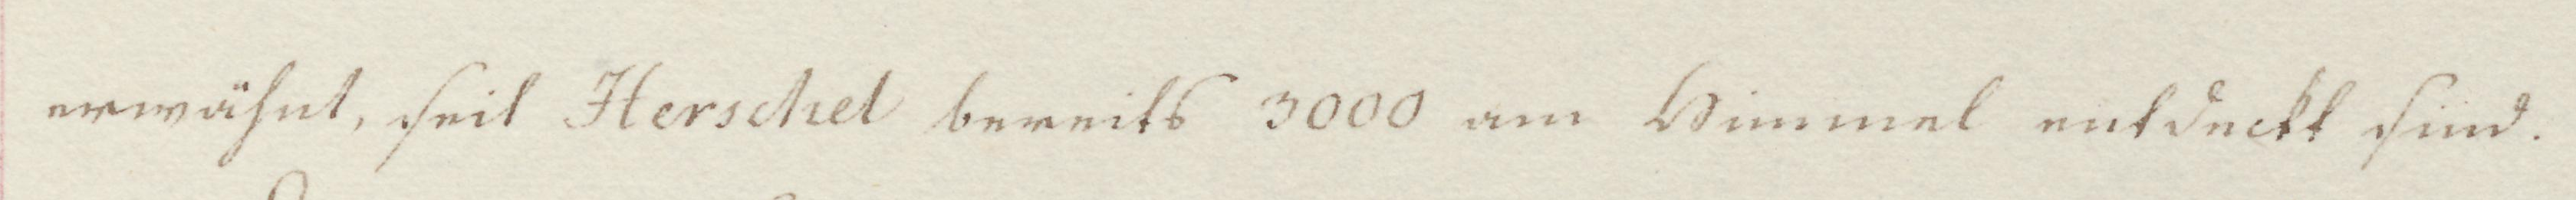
erwähnt, seit Herschel bereits 3000 am Himmel entdeckt sind.
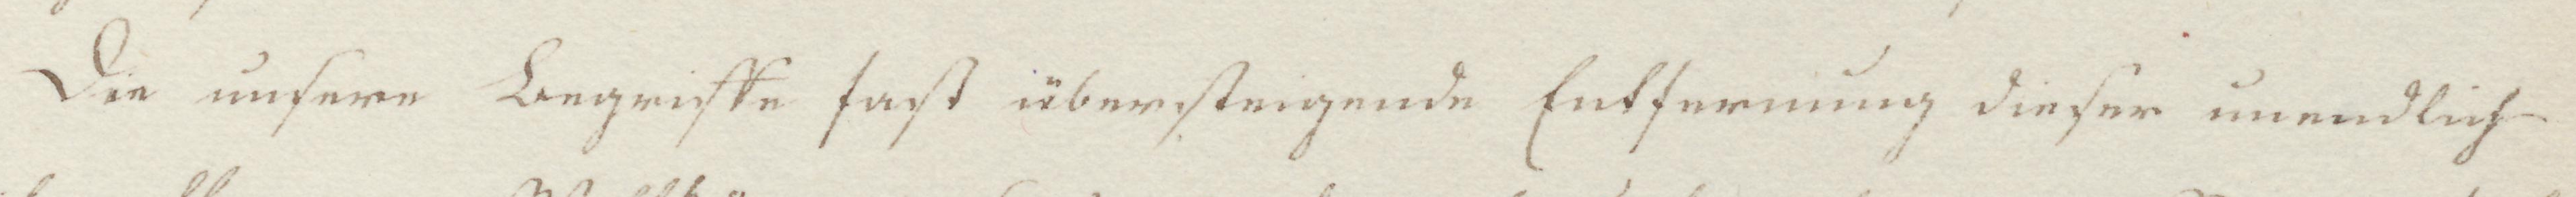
Die unsere Begriffe fast übersteigende Entfernung dieser unendlich
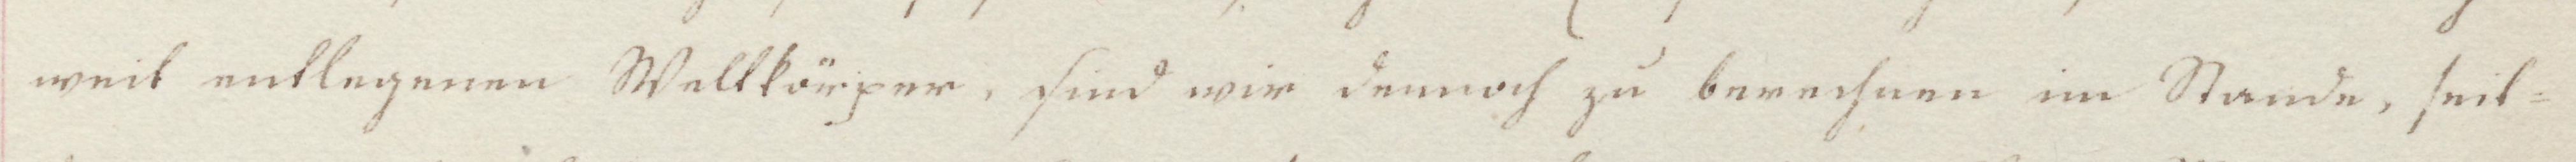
weit entlegenen Weltkörper, sind wir dennoch zu berechnen im Stande, seit-
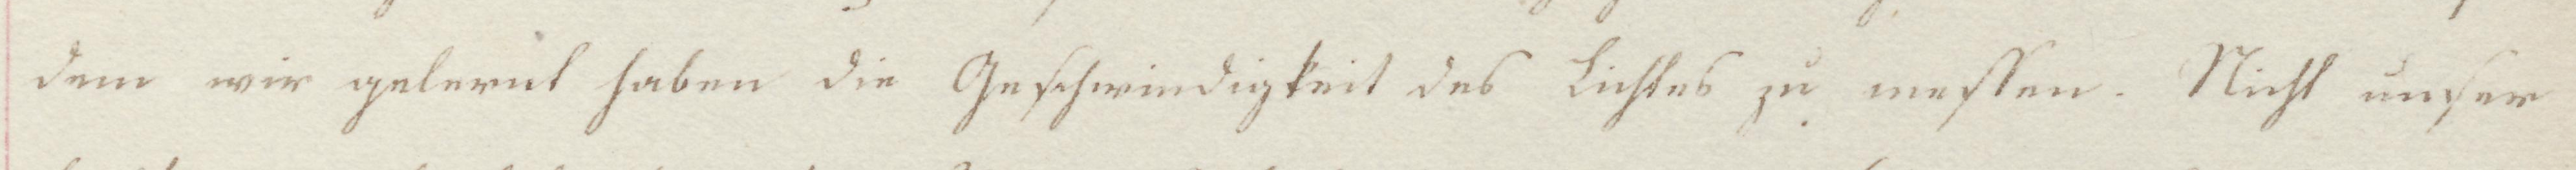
dem wir gelernt haben die Geschwindigkeit des Lichtes zu messen. Nicht unser
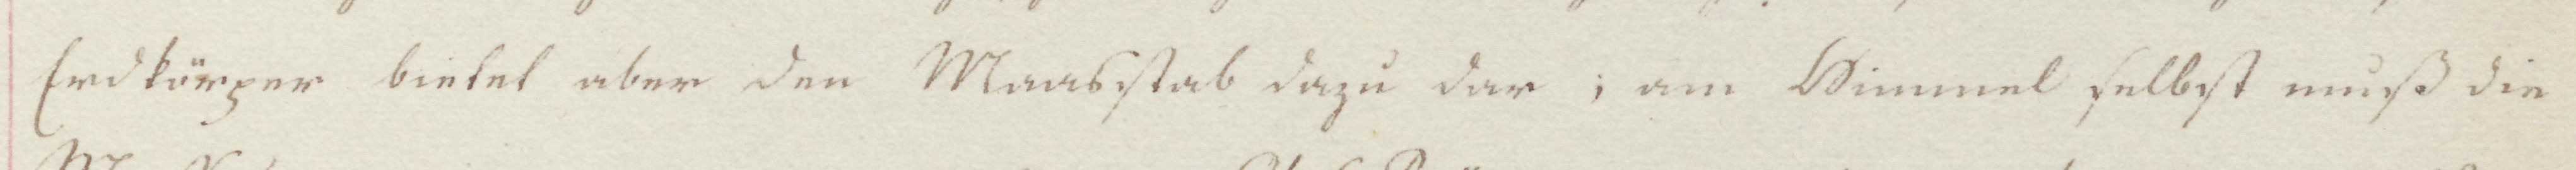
Erdkörper bietet aber den Maasstab dazu dar; am Himmel selbst muß die
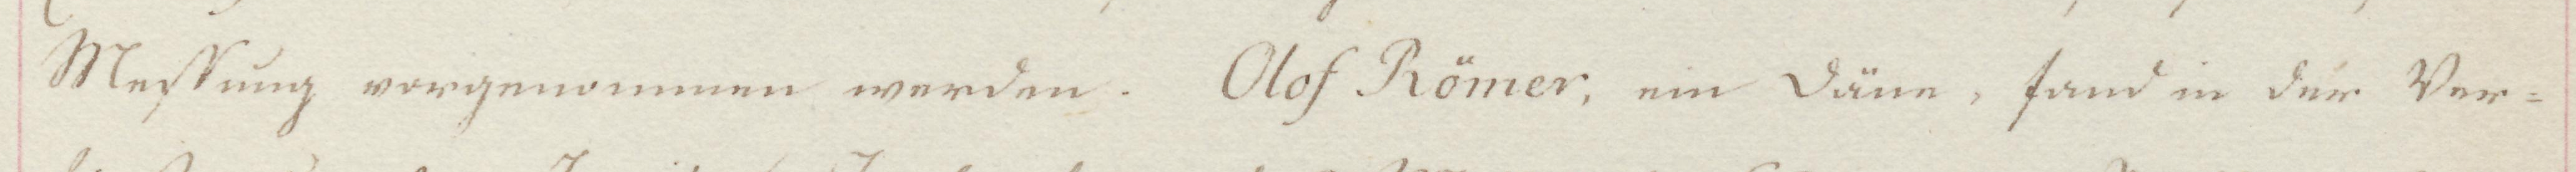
Messung vorgenommen werden. Olof Römer, ein Däne, fand in der Ver-
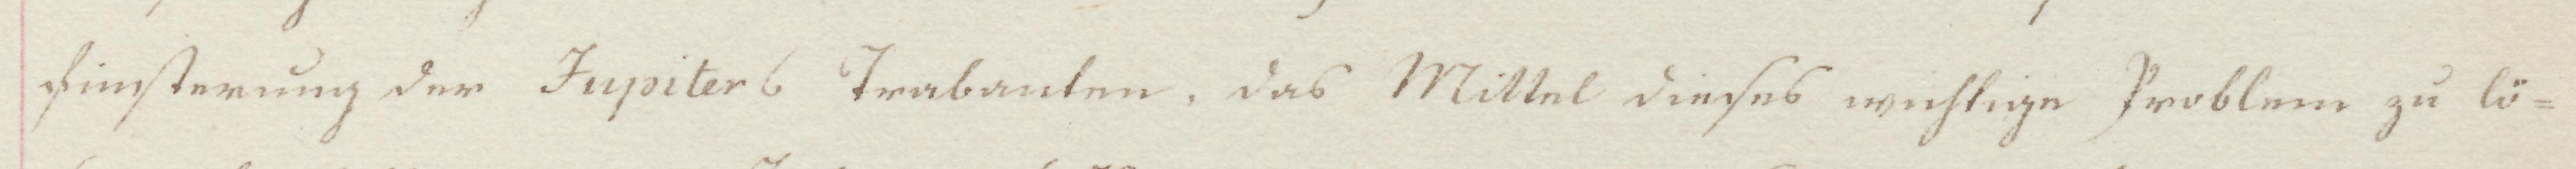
finsterung der Jupiters Trabanten, das Mittel dieses wichtige Problem zu lö-
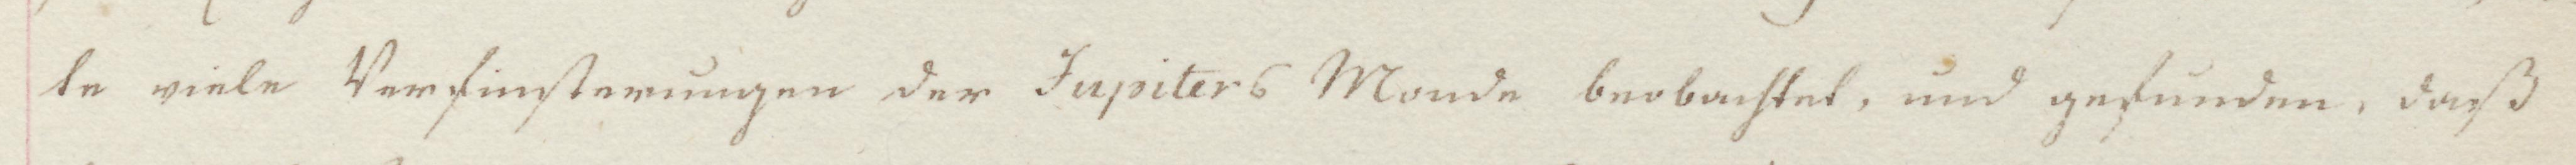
te viele Verfinsterungen der Jupiters Monde beobachtet, und gefunden, daß
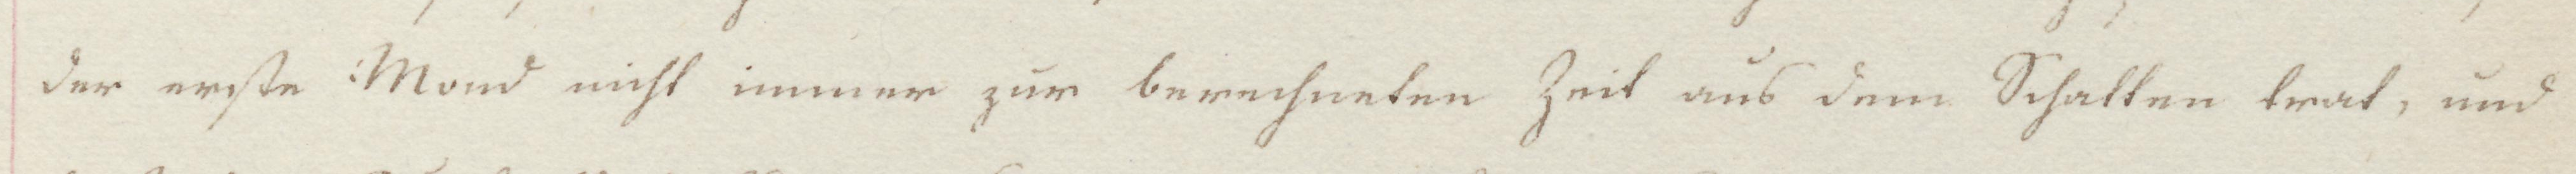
der erste Mond nicht immer zur berechneten Zeit aus dem Schatten trat, und
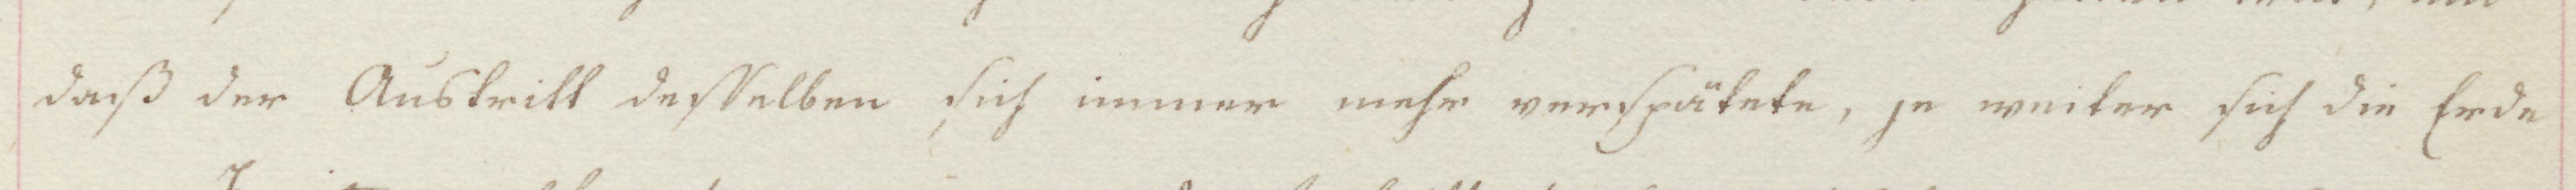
daß der Austritt desselben sich immer mehr verspätete, je weiter sich die Erde
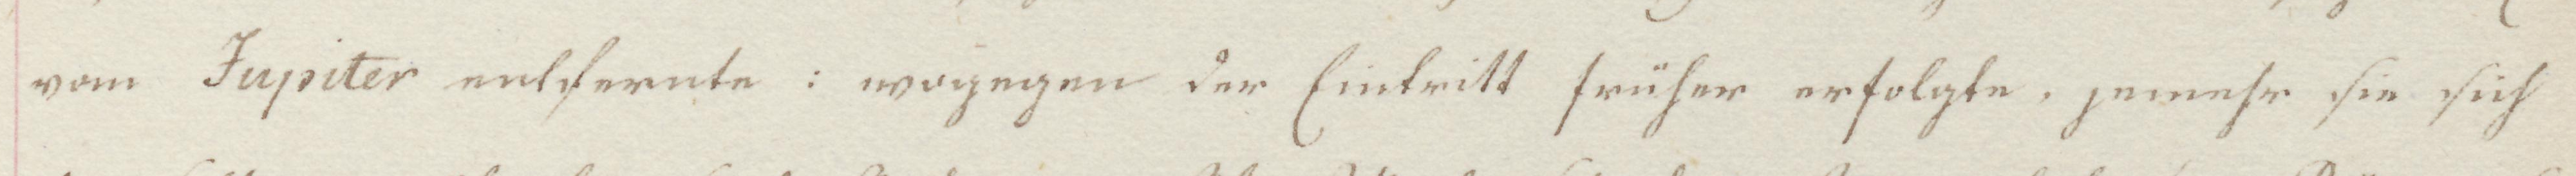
vom Jupiter entfernte: wogegen der Eintritt früher erfolgte, jemehr sie sich
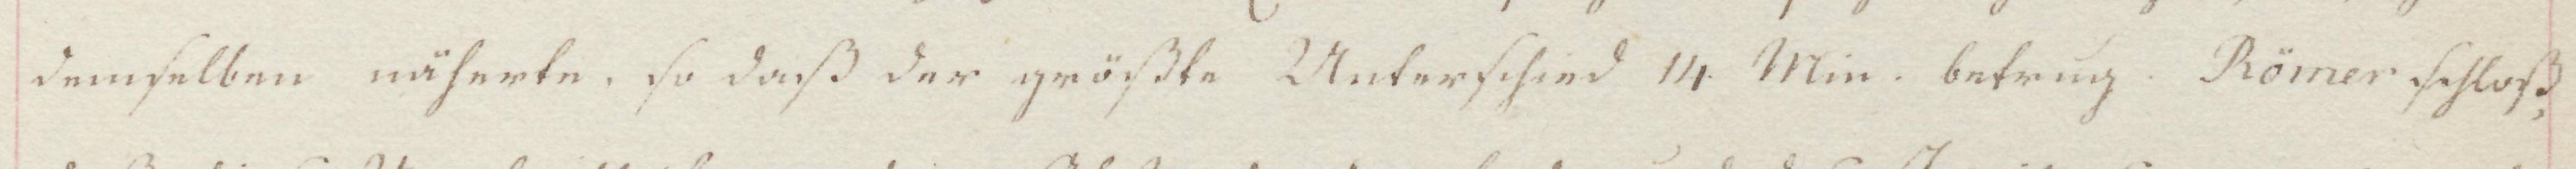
demselben näherte, so daß der größte Unterschied 14 Min. betrug. Römer schloß,
